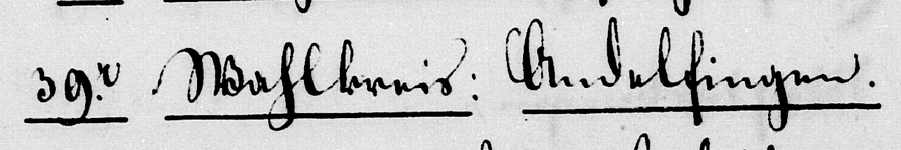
39.r Wahlkreis: Andelfingen.
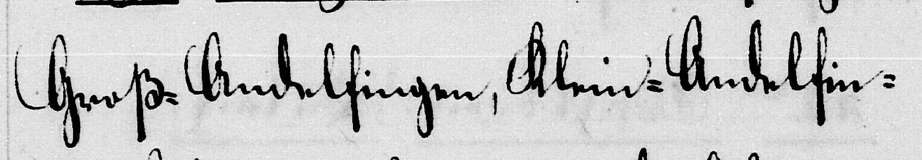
Groß-Andelfingen, Klein-Andelfin¬
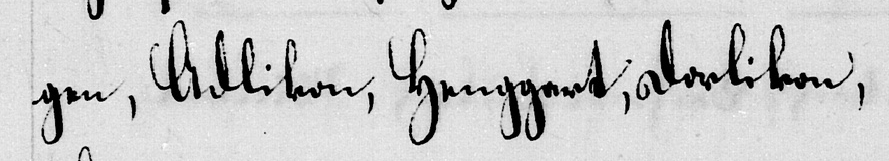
gen, Adlikon, Henggart, Dorlikon,
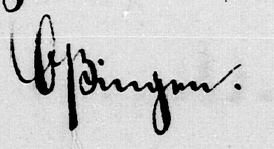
Oßingen.
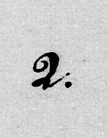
2.
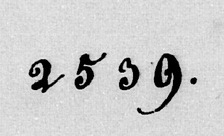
2539.
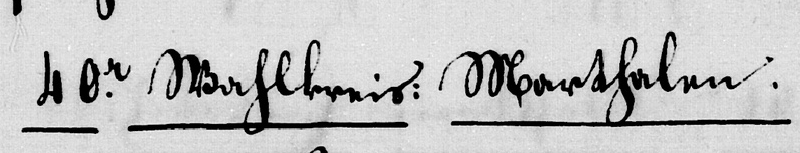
40.r Wahlkreis: Marthalen:
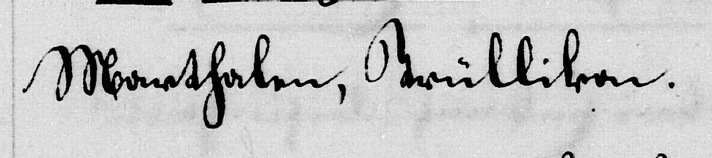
Marthalen, Trüllikon.
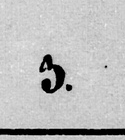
3.
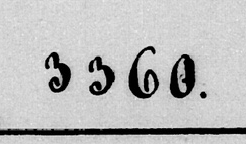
3360.
